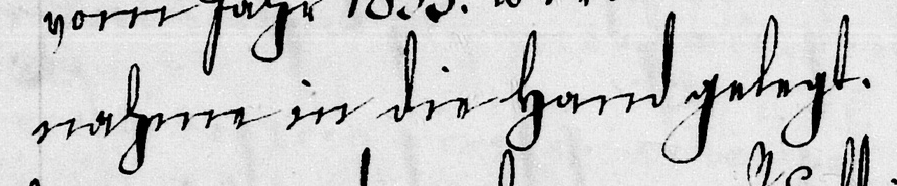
nahme in die Hand gelegt.
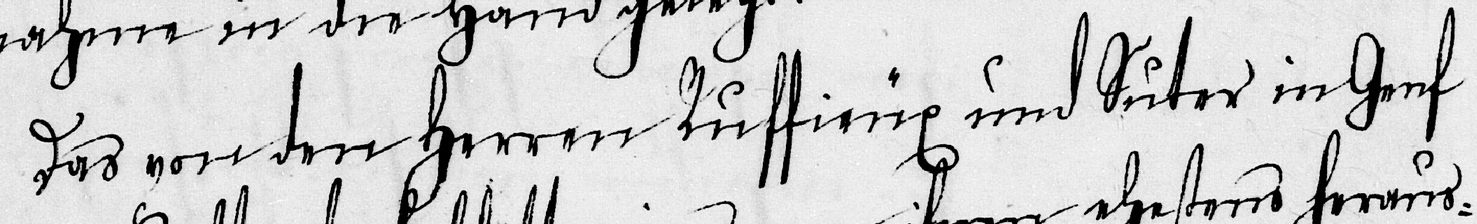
Das von den Herren Ruffieux und Suter in Genf
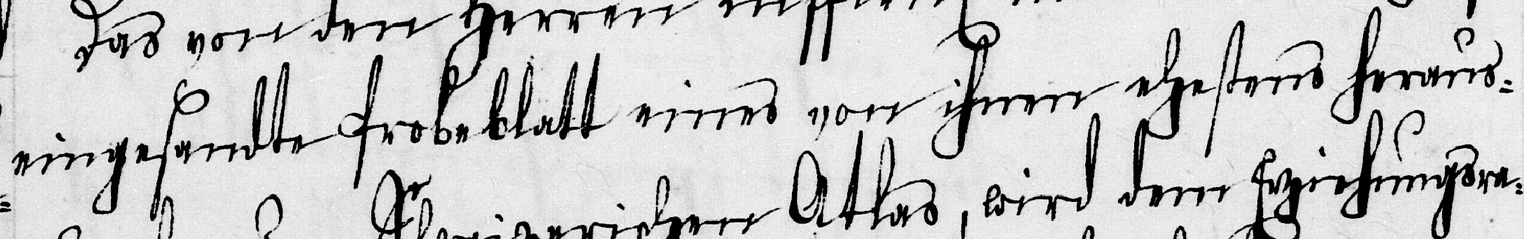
eingesandte Probeblatt eines von ihnen ehestens heraus¬
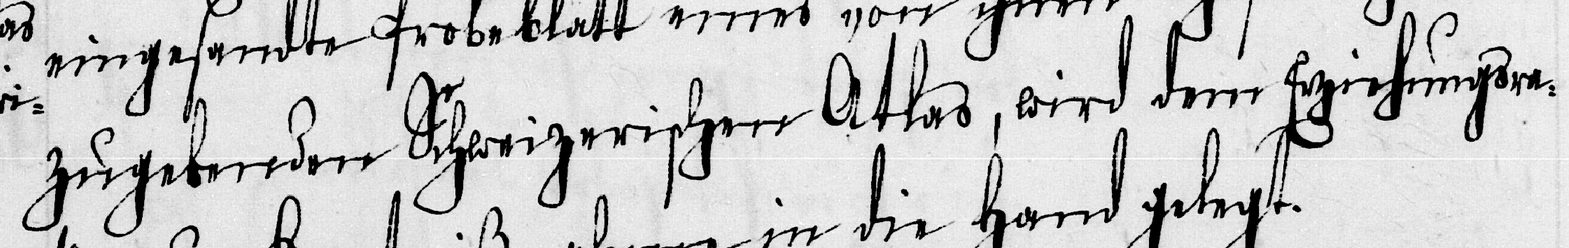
zugebenden Schweizerischen Atlas, wird dem Erziehungsra¬
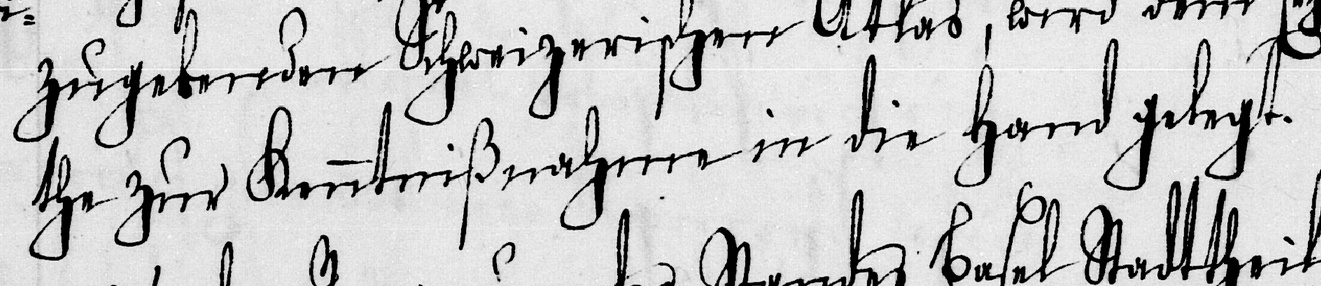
the zur Kenntnißnahme in die Hand gelegt.
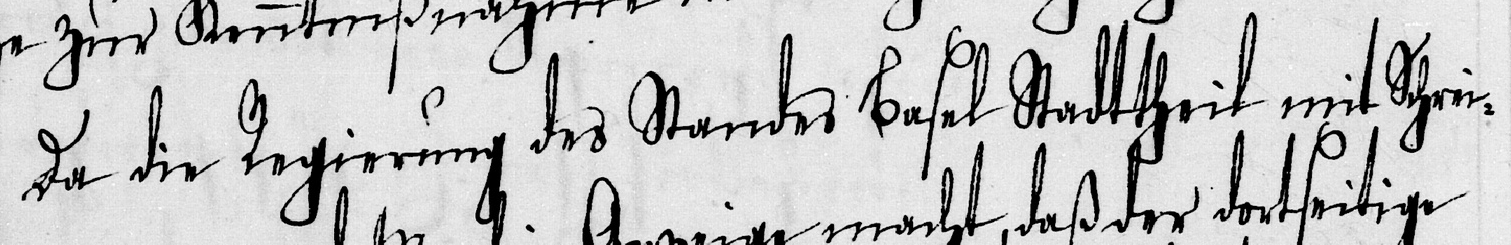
Da die Regierung des Standes Basel Stadttheil mit Schr¬
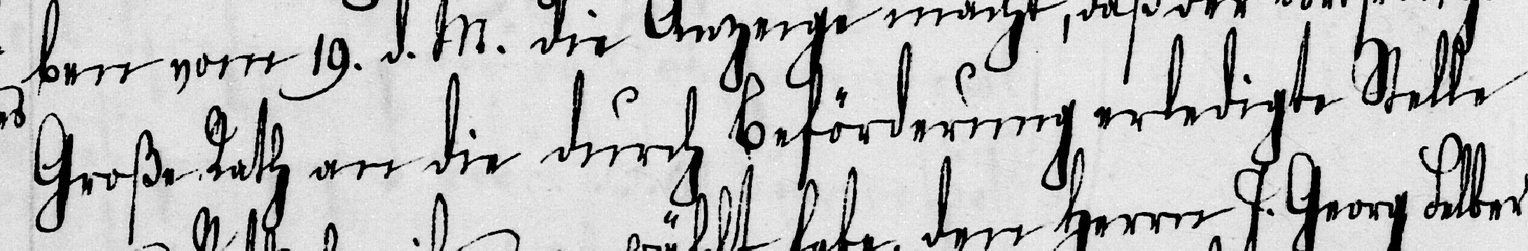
Große Rath an die durch Beförderung erledigte Stelle
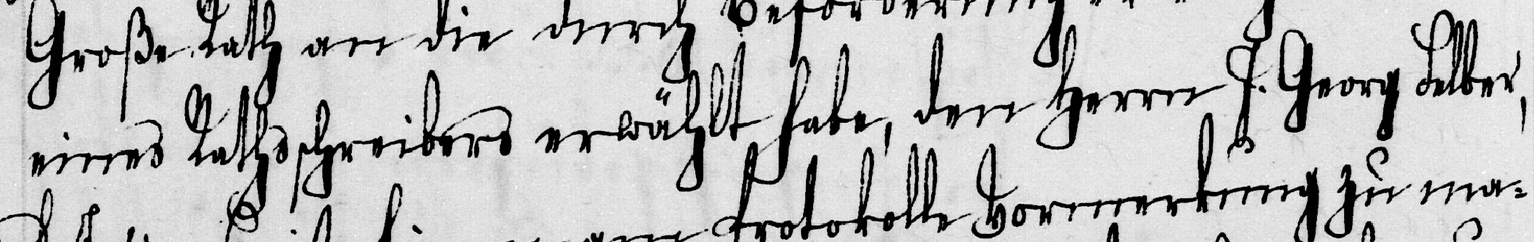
eines Rathsschreibers erwählt habe, den Herrn J. Georg Fel¬
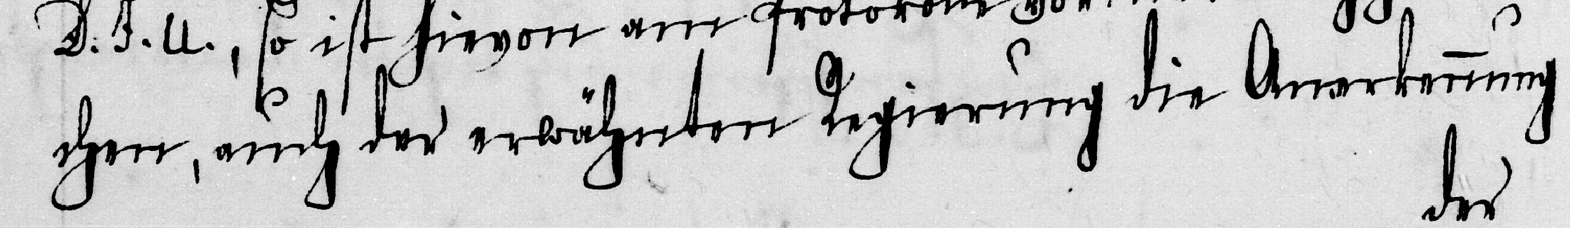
chen, auch der erwähnten Regierung die Anerkennung
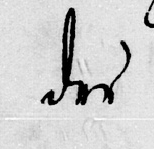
ber,
